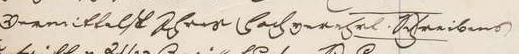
Vermittelst Ihres hochverehrl. Schreibens
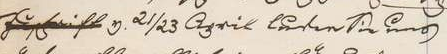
Zuschrift v. 21/23 April luden Sie uns
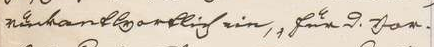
rückantwortlich ein, «für d. Vor-
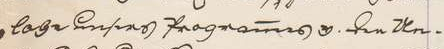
lage unsers Programmes v. den Un-
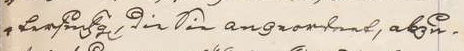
tersuchungen, die Sie angeordnet, abzu-
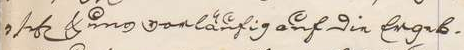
setzen & uns vorläufig auf die Ergeb-
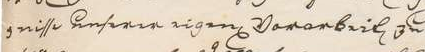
nisse unserer eigenen Vorarbeiten zu
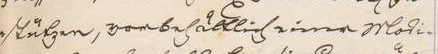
stützen, vorbehältlich einer Modi-
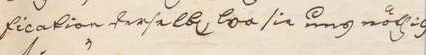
fication derselben, wo sie uns nöthig
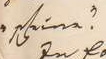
scheine».
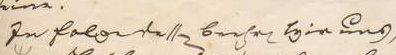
In Folge dessen beehren wir uns,
